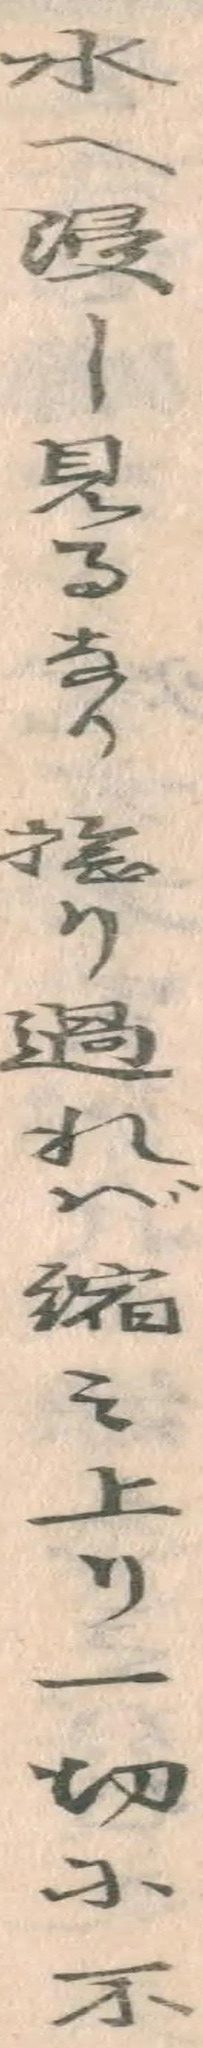水へ浸し見るなり捻り過れば縮み上り一切に不
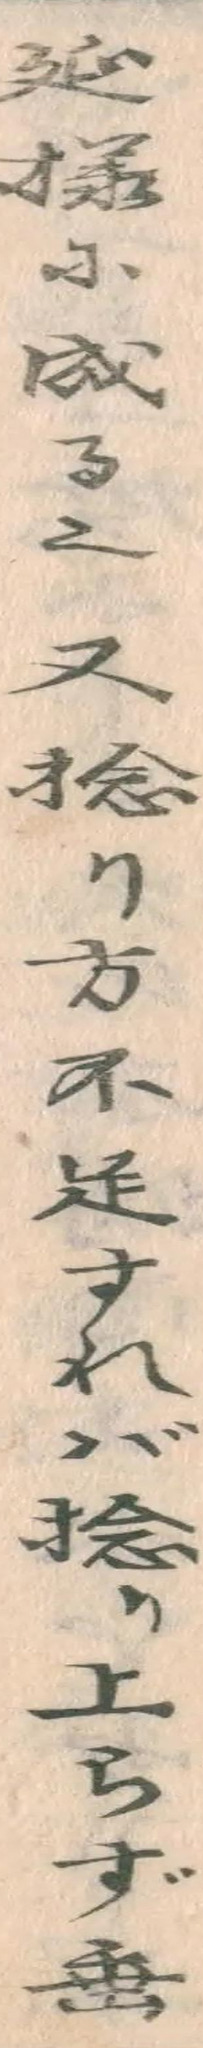延様に成る也又捻り方不足すれば捻り上らず垂
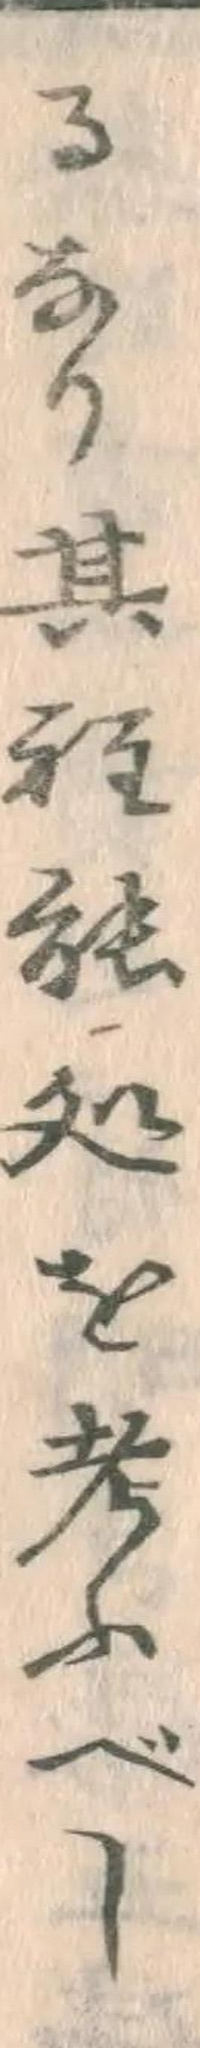るなり其程能処を考ふべし
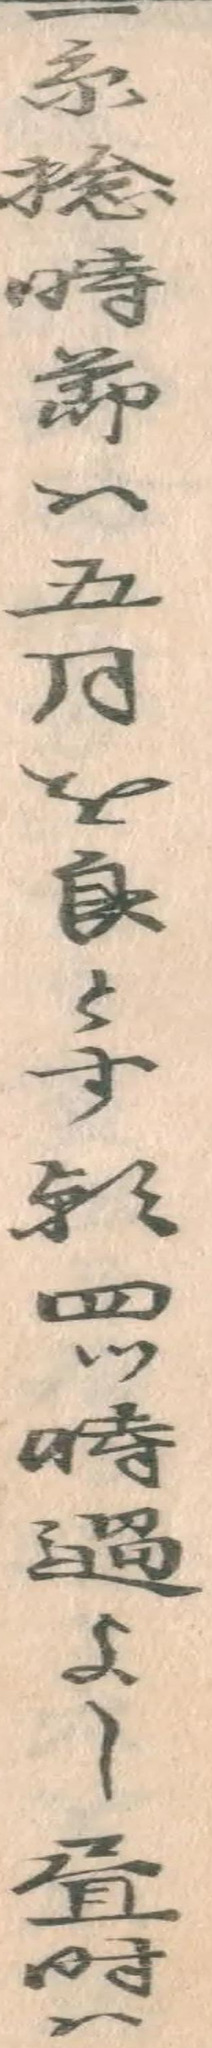一糸捻時節は五月を良とす朝四ッ時過よし昼時は
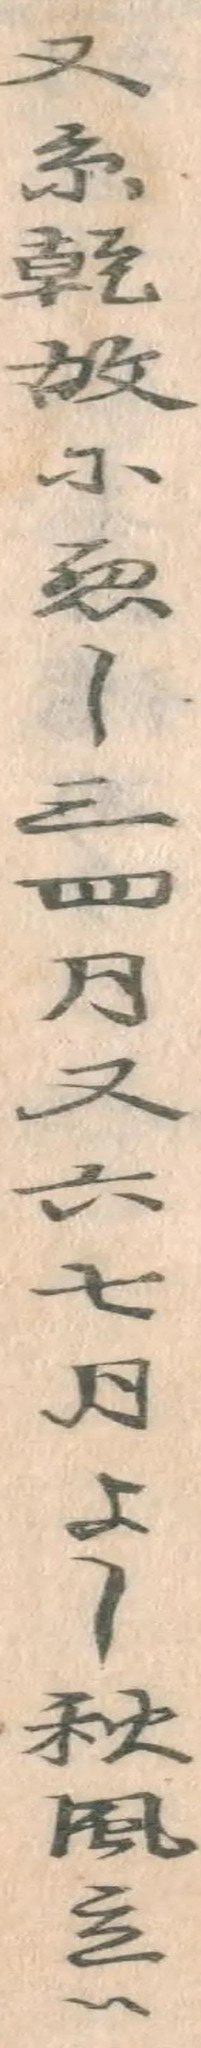又糸乾故に悪し三四月又六七月よし秋風立は
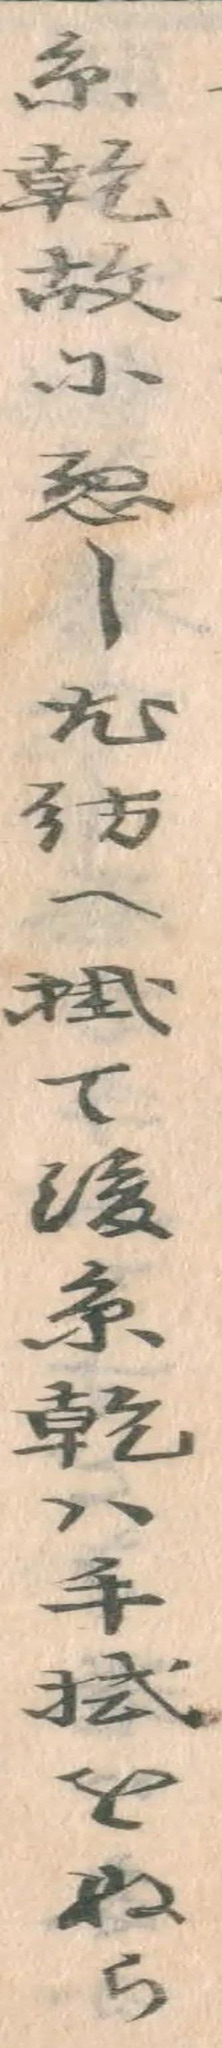糸乾故に悪し尤紡へ掛て後糸乾は手拭をぬら
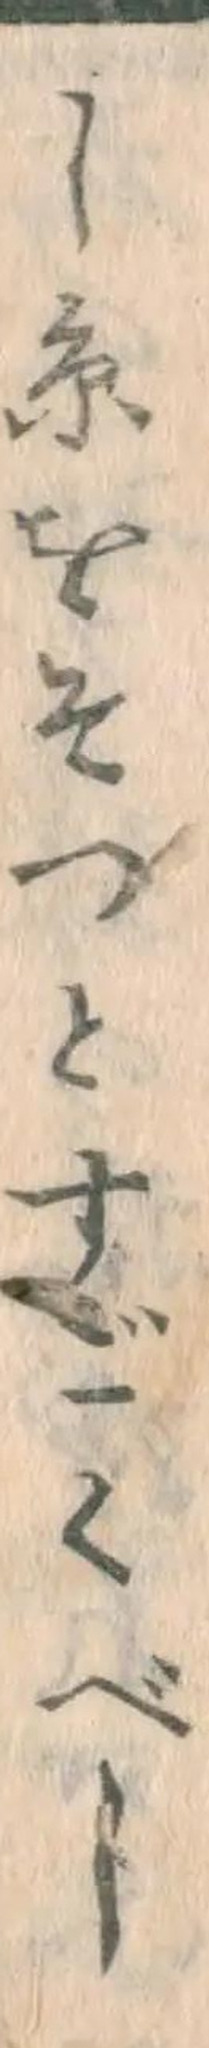し糸をそつとすごくべし

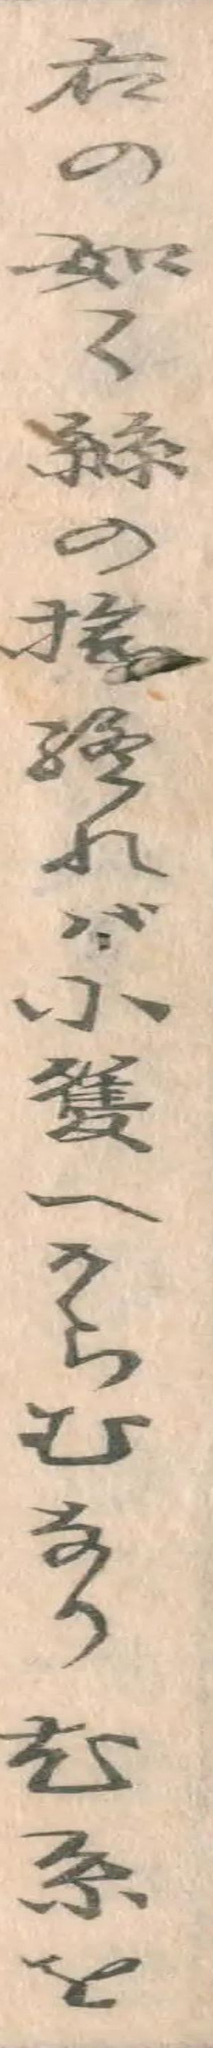右の如く糸の捻終れば小篗へからむなり尤糸を
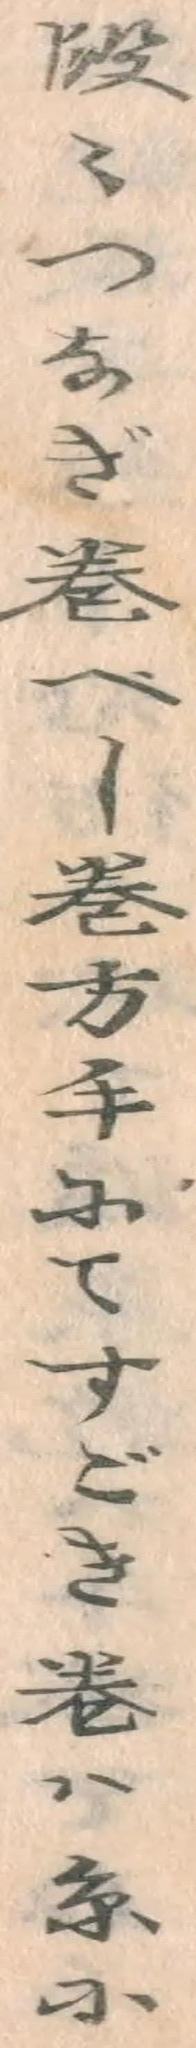段々つなぎ巻べし巻方手にてすごき巻は糸に
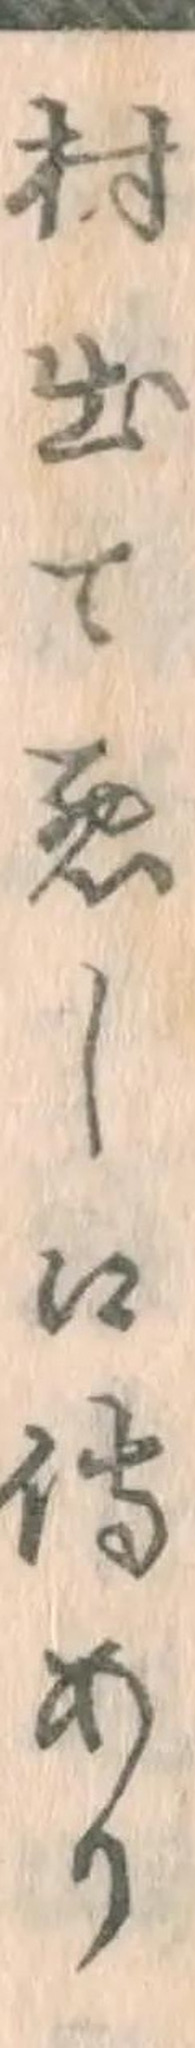村出て悪し口伝あり
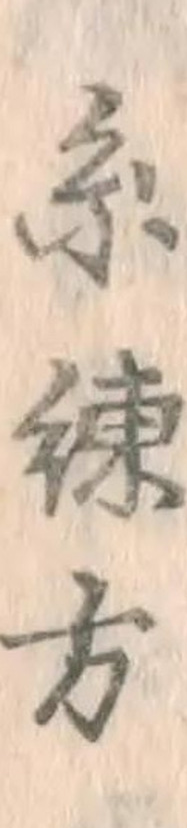糸練方
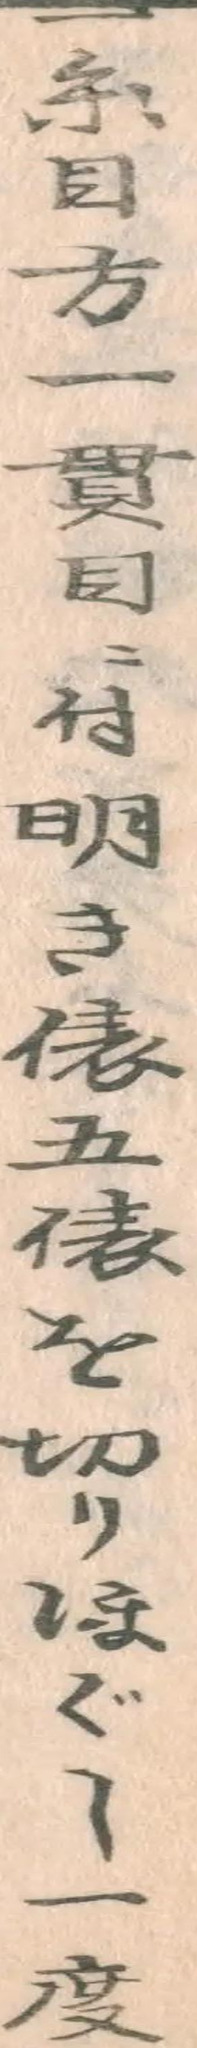一糸目方一貫目に付明き俵五俵を切りほぐし一度
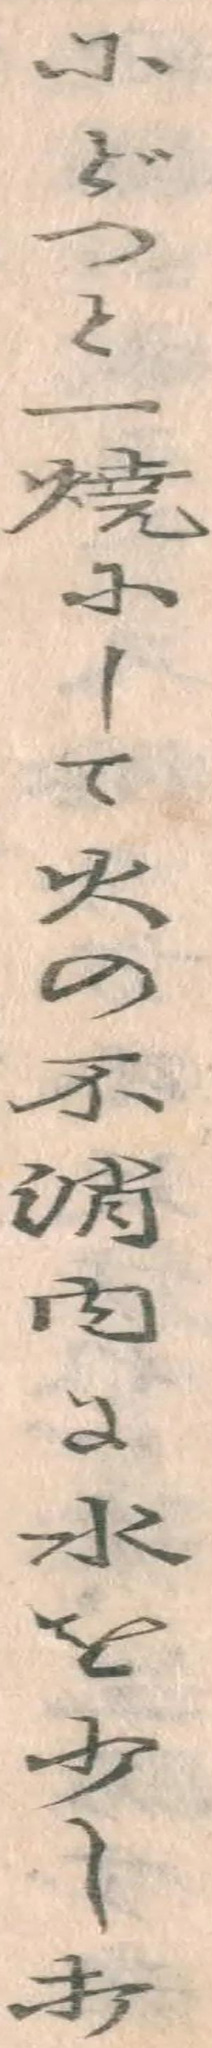にどつと一焼にして火の不消内に水を少し打
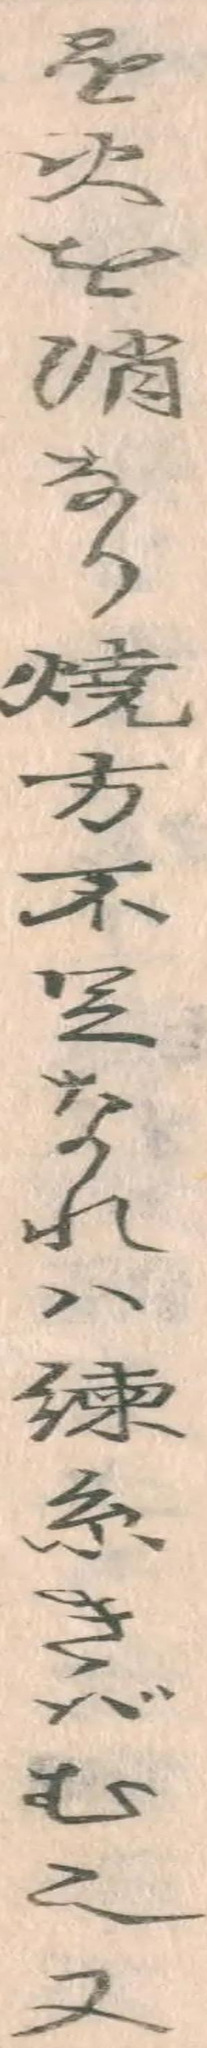懸火を消なり焼方不足なれは練糸きばむ也又
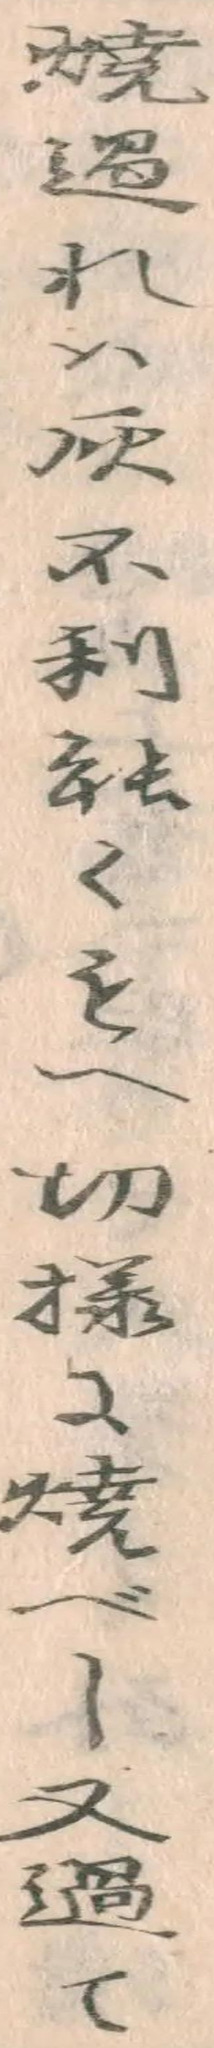焼過れは灰不利能くもへ切様に焼べし又過て
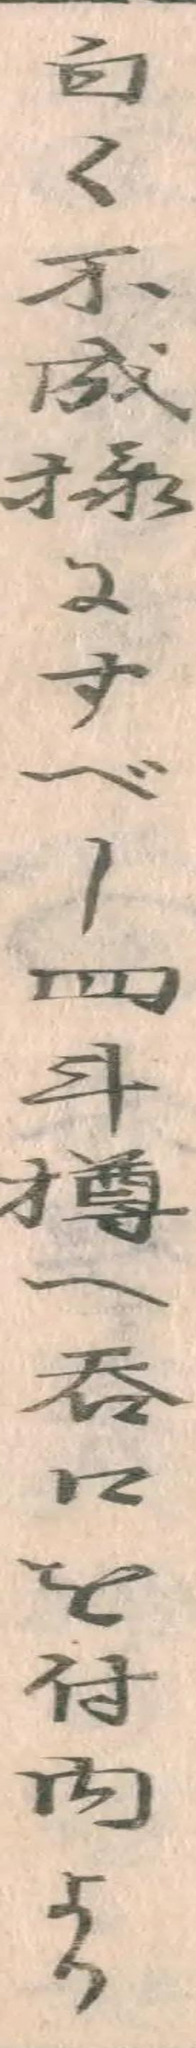白く不成様にすべし四斗樽へ吞口を付内より
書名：機織彙編 5巻. [1]
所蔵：国立国会図書館 National Diet Library, JAPAN
